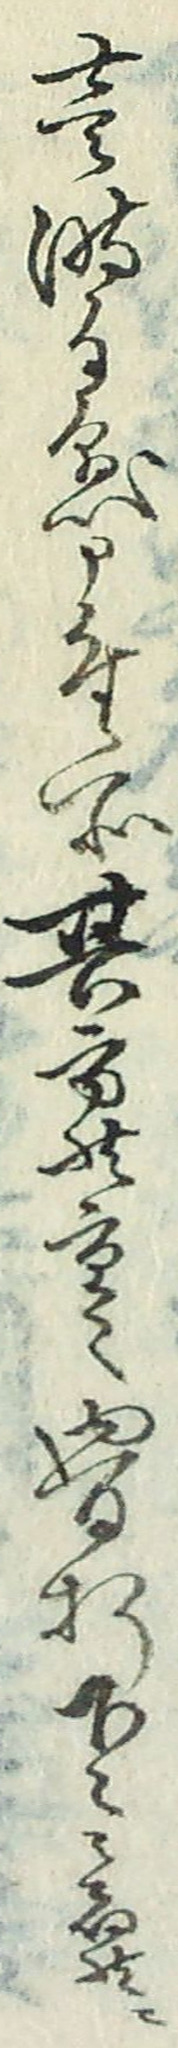壱時手懸申付候所其方共重々骨折下々之者共ニ
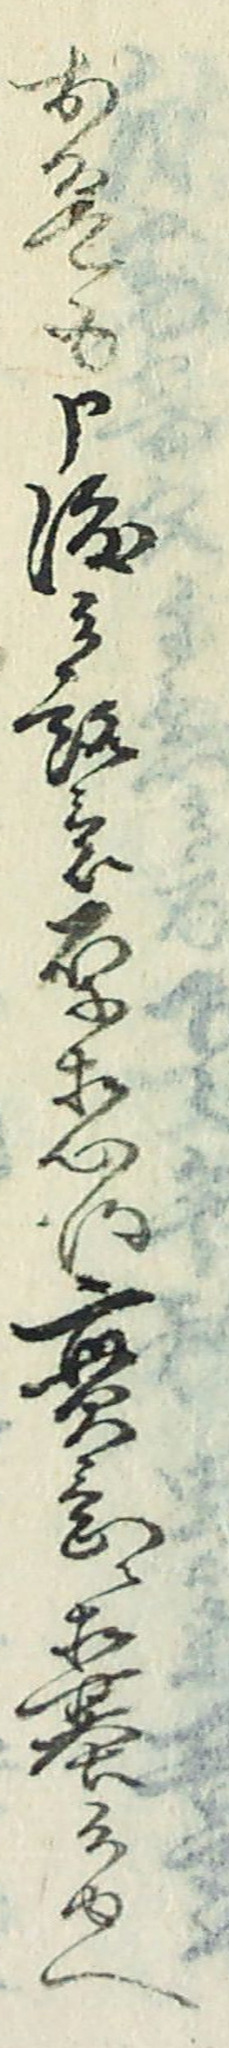おゐても申渡候趣意厚相心得實意ニ相基候ゆへ
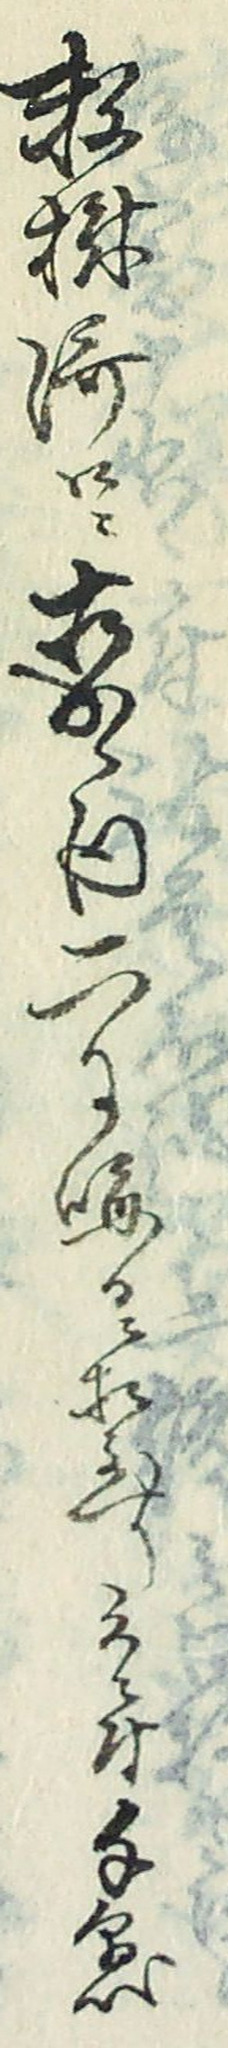数株済口ニ相成候内二月晦日ニ相至り候ニ付手懸
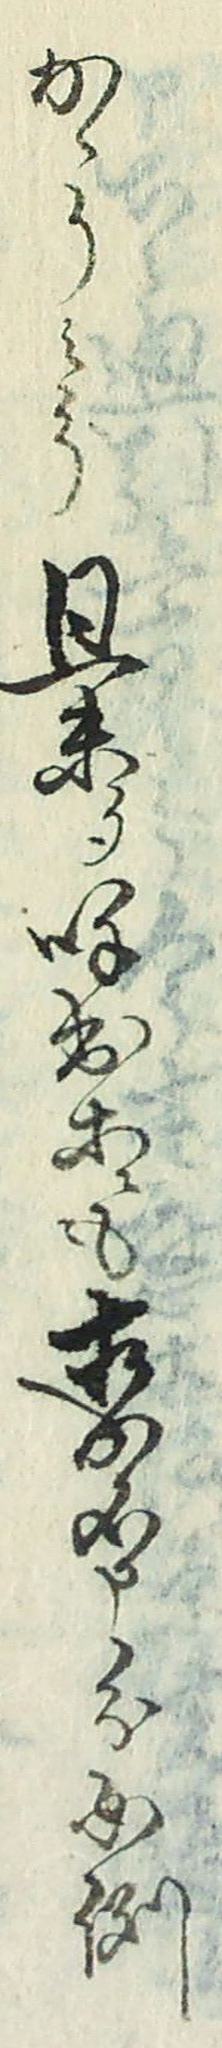かゝり候分且未タ呼出等ニも相成不申分如例
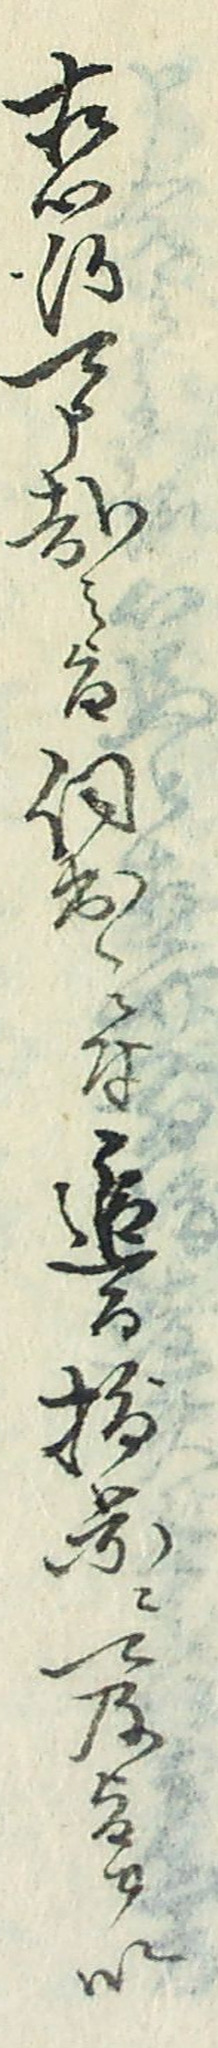相心得可申哉之旨伺出候ニ付追而指圖ニ可及旨ヲ以
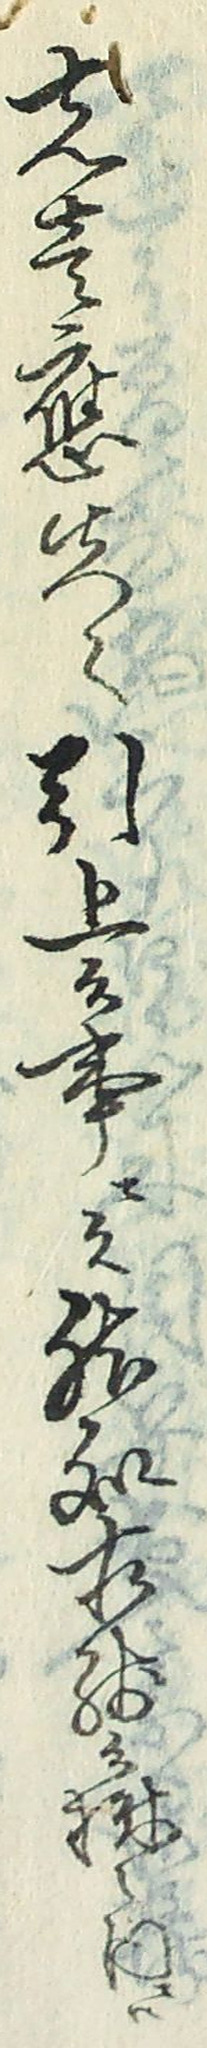先壱應夫々引上候事ニ候然処相残候株之内ニハ
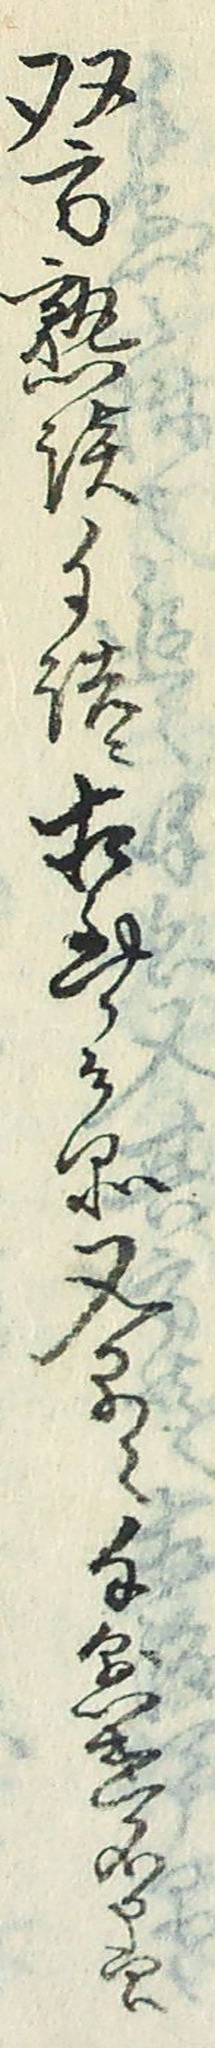双方熟談手詰ニ相至り候品又早々手懸遣不申而ハ
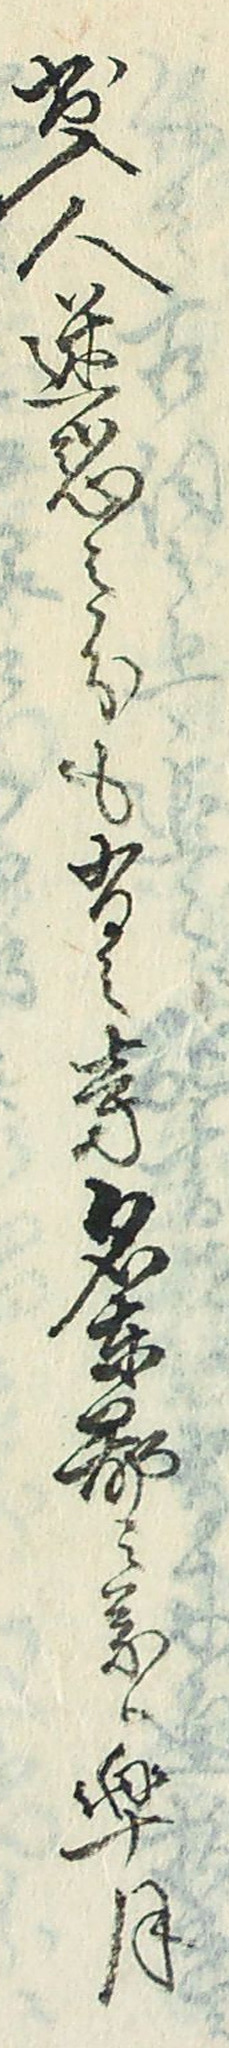出入人迷惑之分も有之旁名東郡之義ハ皐月
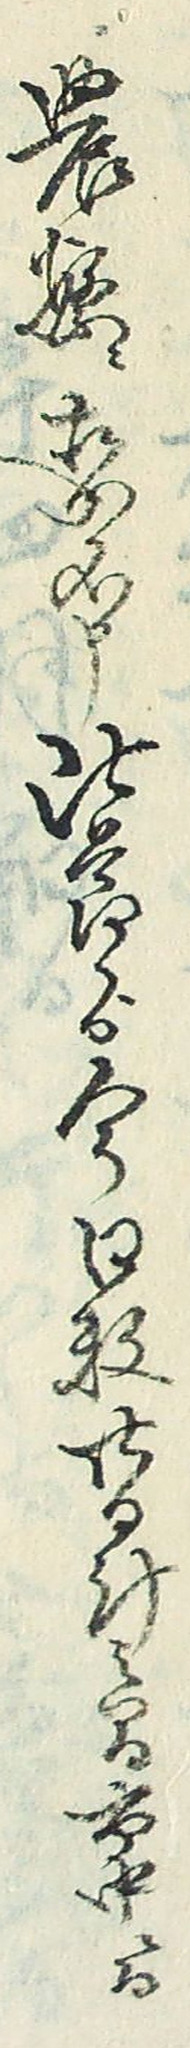農繁ニ相成不申此節ゟ今日数廿日計之間市中ニ而

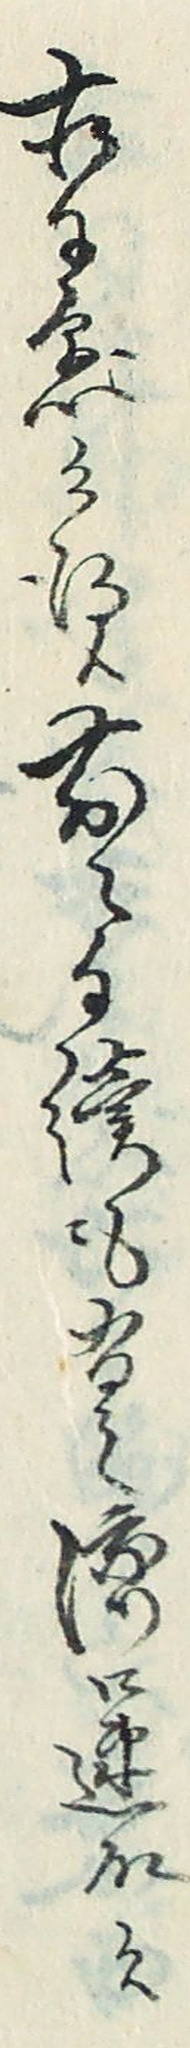相手懸候得ハ前々手續も有之済口速取候
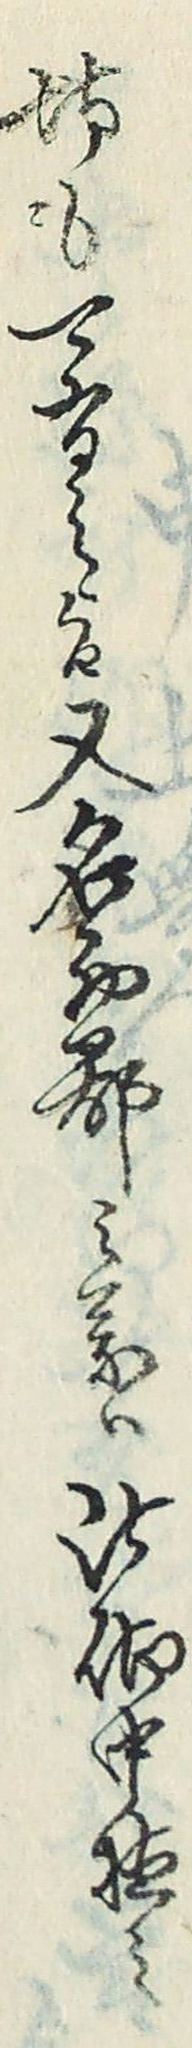場も可有之旨又名西郡之義ハ此砌中植之
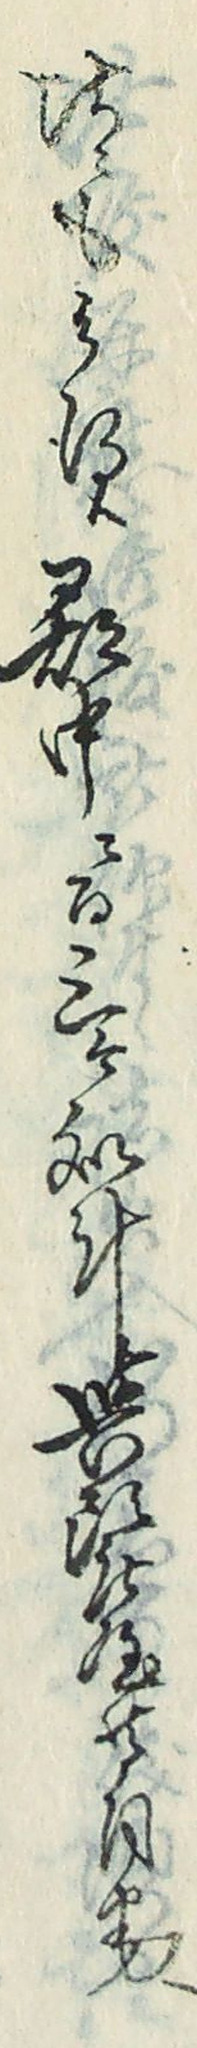比ニも候得ハ郡中ニ而三ケ処計與頭庄屋共自宅へ
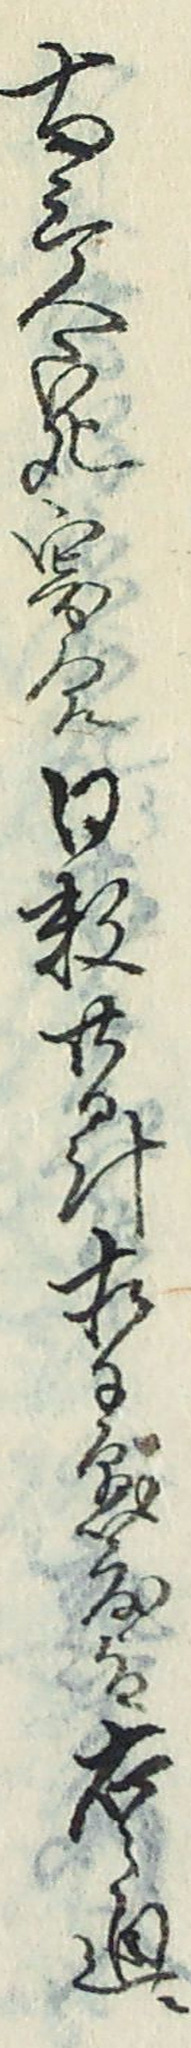両三人宛寄合日数廿日計相手懸度旨右之通ニ
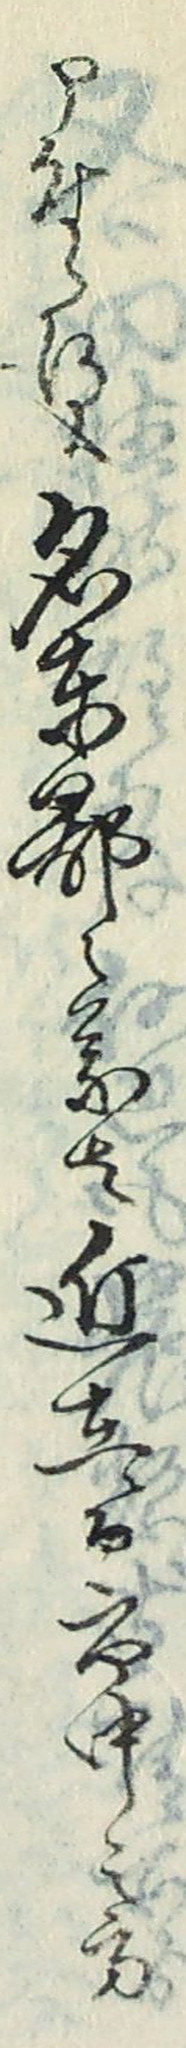申付候得ハ名東郡之義者近在ニ而市中之方
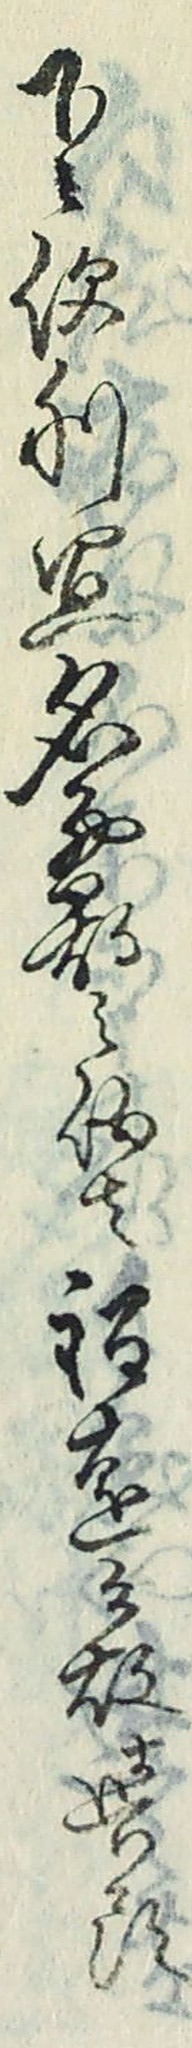下々便利宜名西郡之儀者程遠候故與頭
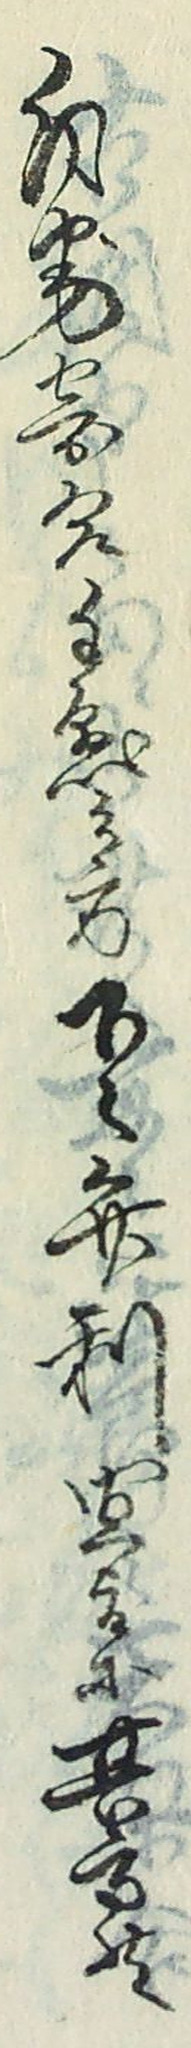自宅寄合手懸之方下々便利宜旨等其方共
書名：諸御趣意書并御下知向之写
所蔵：鳴門教育大学 Naruto University of Education
